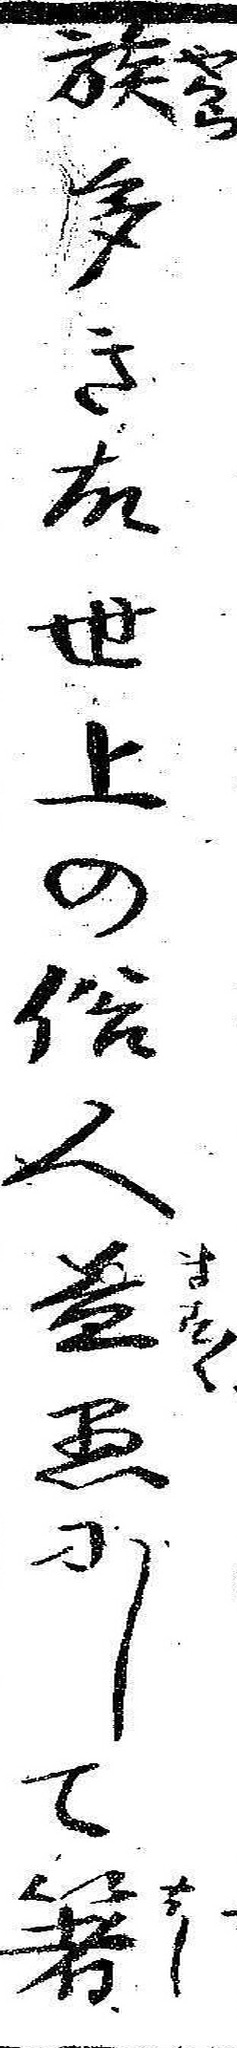族多き故世上の俗人益愚にして箸
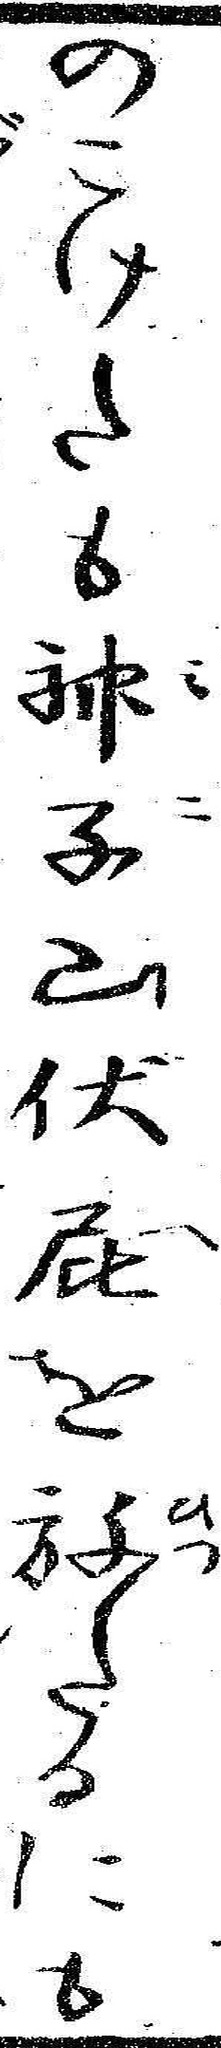のこけたも神子山伏屁を放たるにも
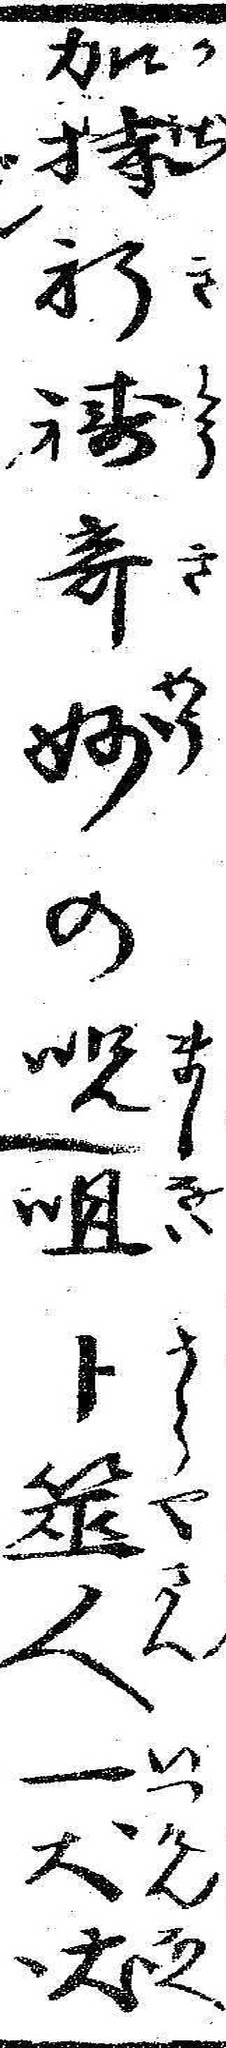加持祈祷奇妙の呪咀卜筮人一犬吠
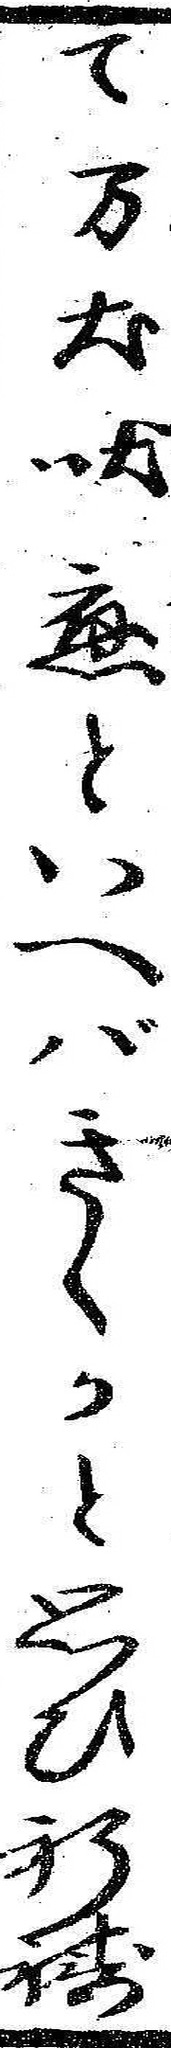て万犬吠応といへばきくかと思ひ祈祷
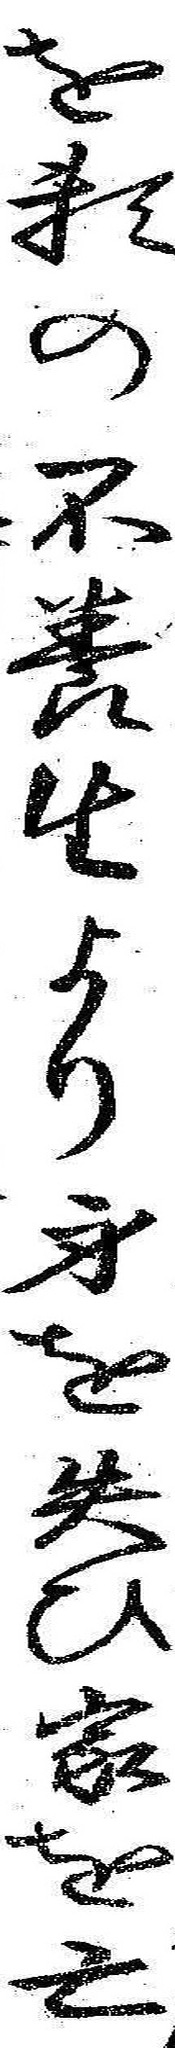を頼の不養生より身を失ひ家を亡
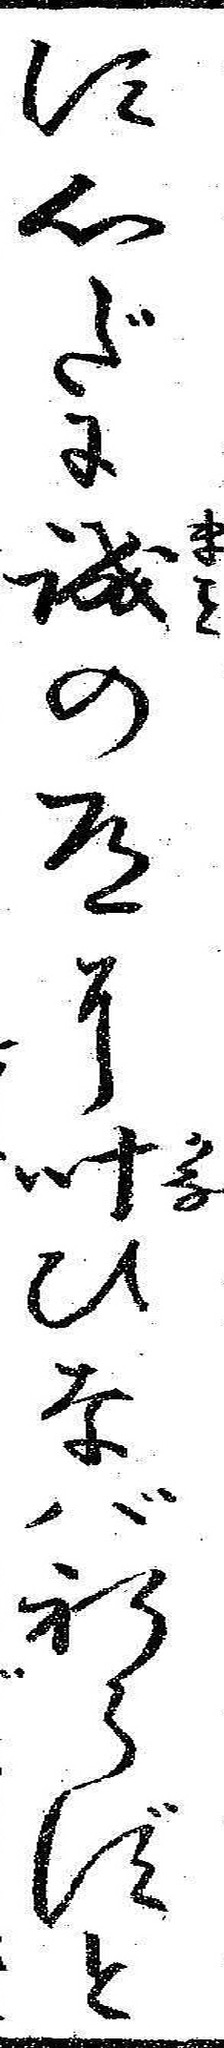す心だに誠の道に叶ひなば祈らずと
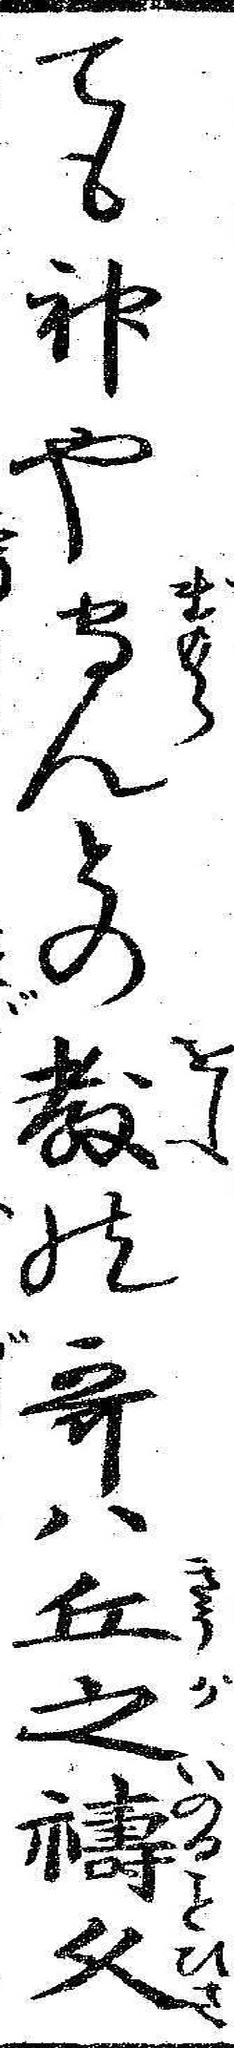ても神や守んとの教の哥は丘之祷久
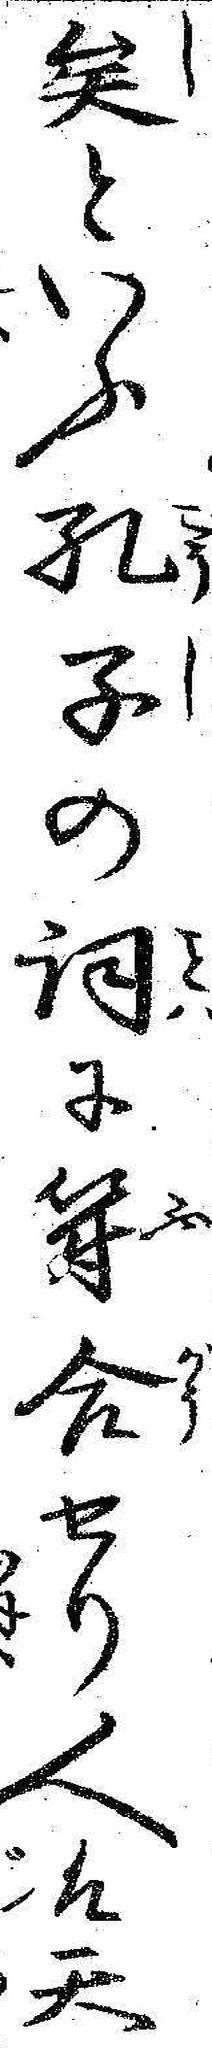矣といふ孔子の詞に符合せり人は天
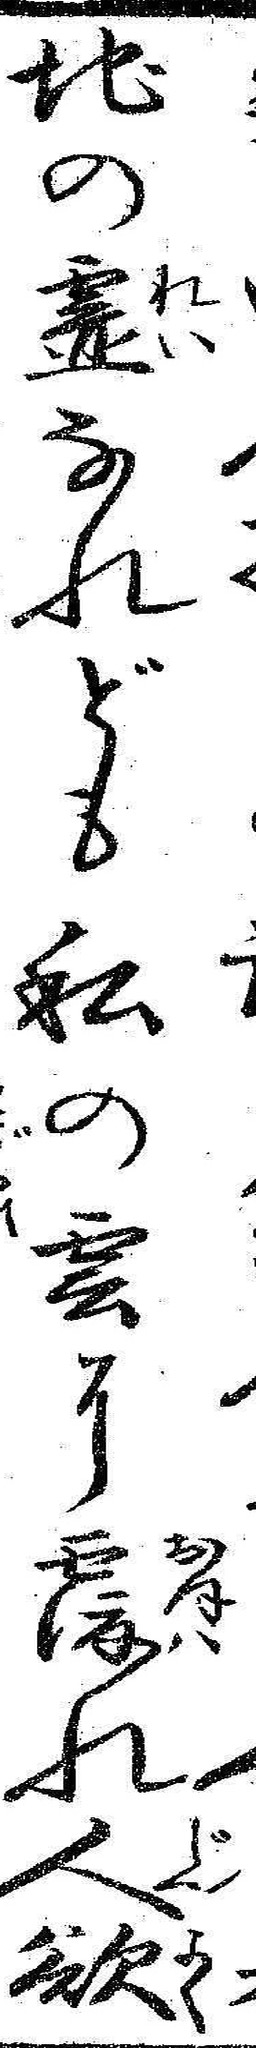地の霊なれども私の雲に覆れ人欲
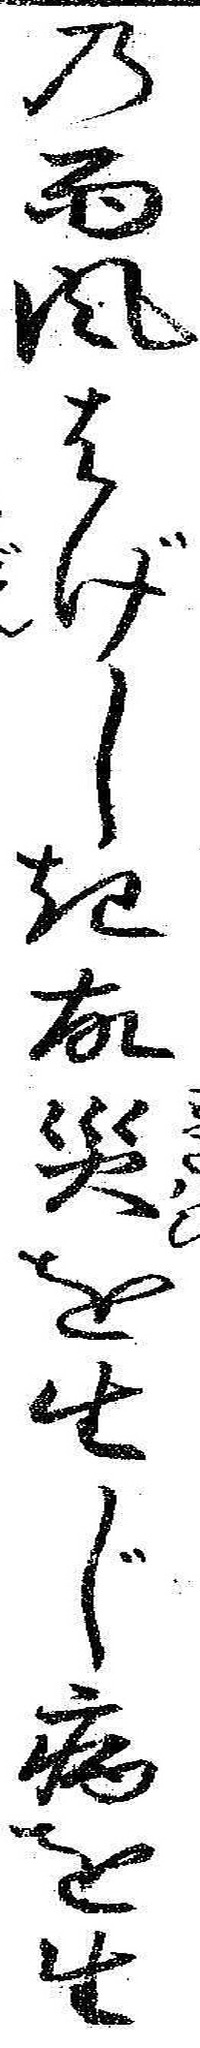の雨風はげしき故災を生じ病を生
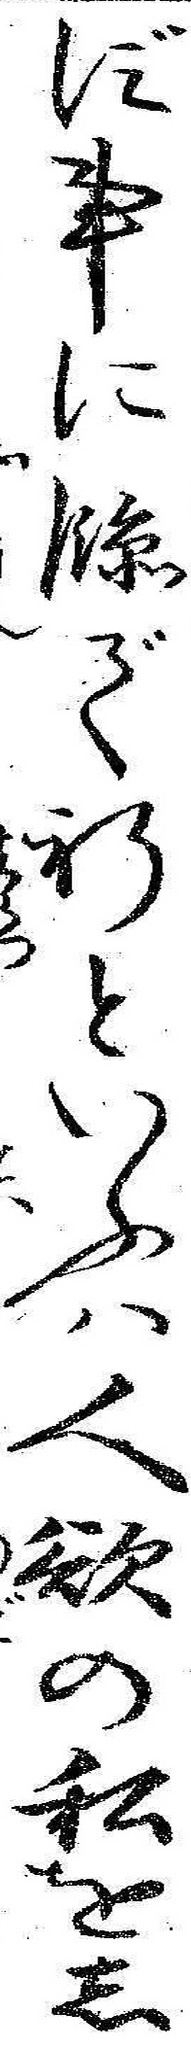ず事に臨で祈といふは人欲の私をし
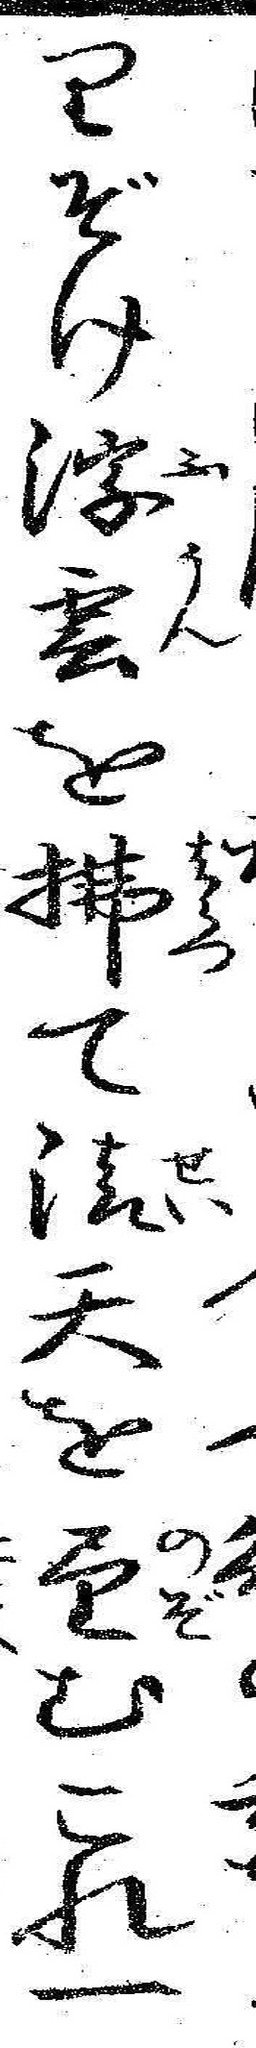りぞけ浮雲を払て清天を望むこれ一
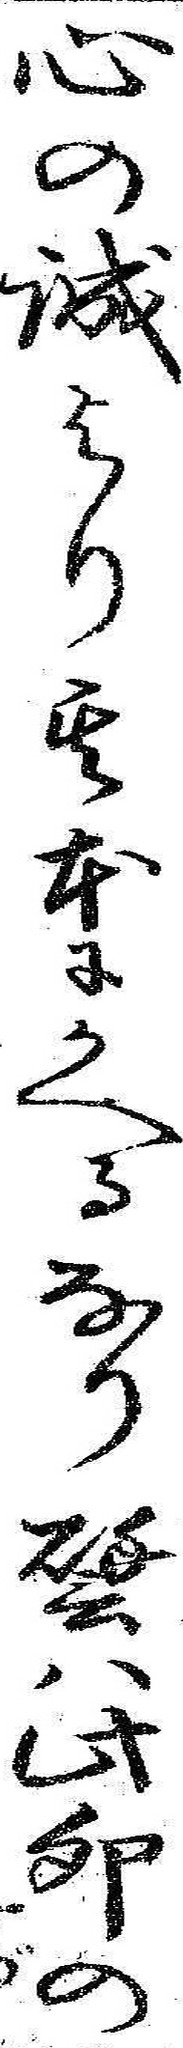心の誠より其本にかへるなり譬は此卯の
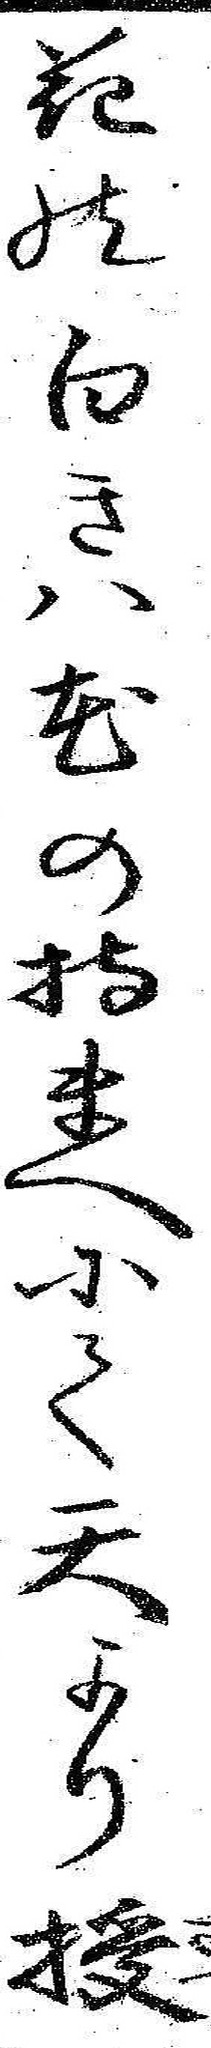花の白きは花の持まへにて天より授

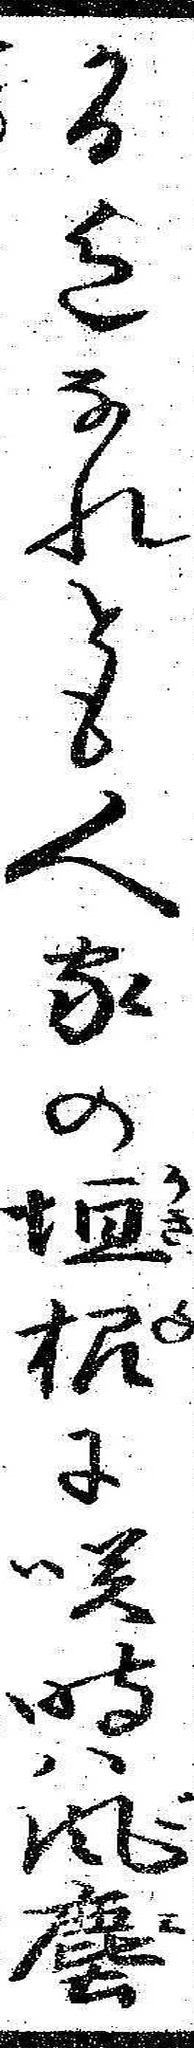かる色なれとも人家の垣根に咲時は風塵
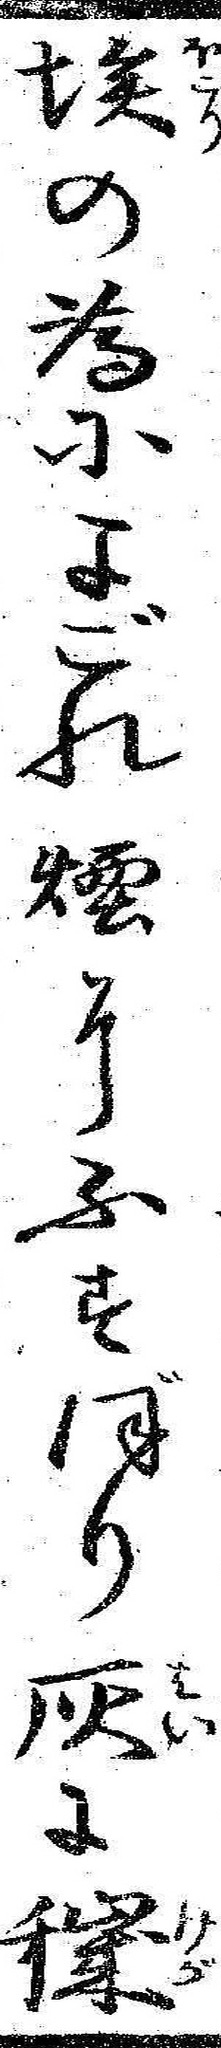埃の為によごれ煙にふすぼり灰に穢
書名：根無草後編
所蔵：国文学研究資料館
